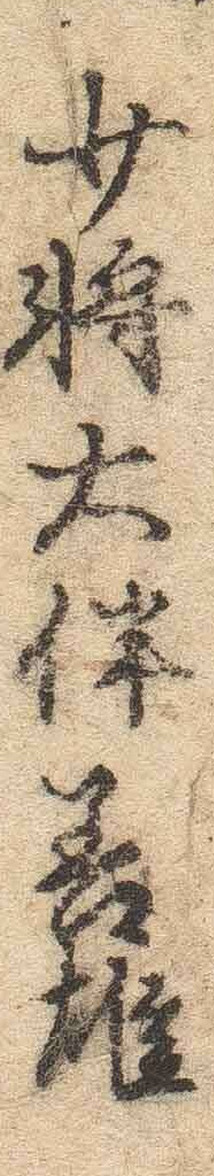少将大伴善雄
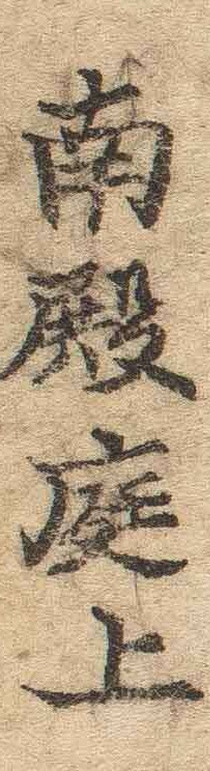南殿庭上

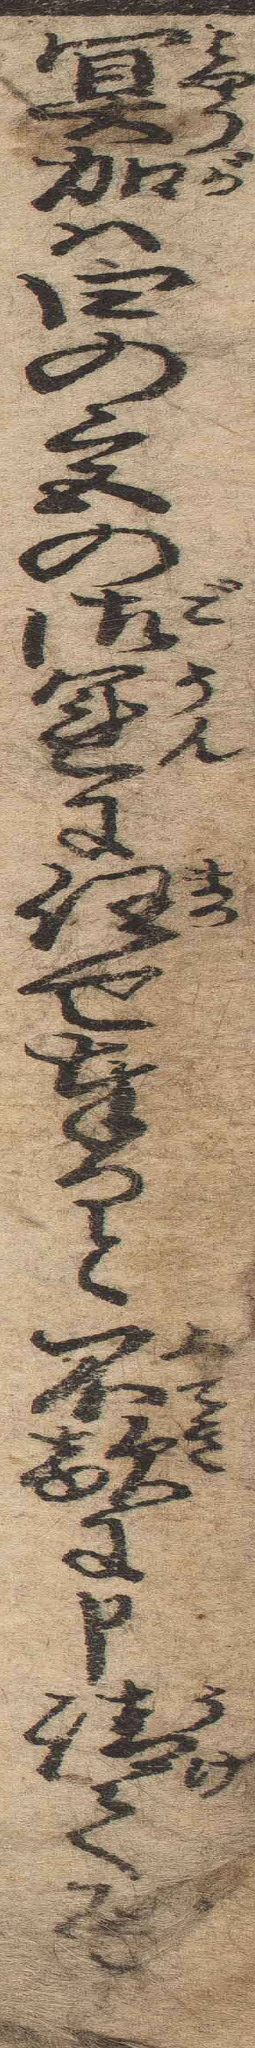冥加は四の宮の御運に任せ奉ると不敵に申請てぞ参
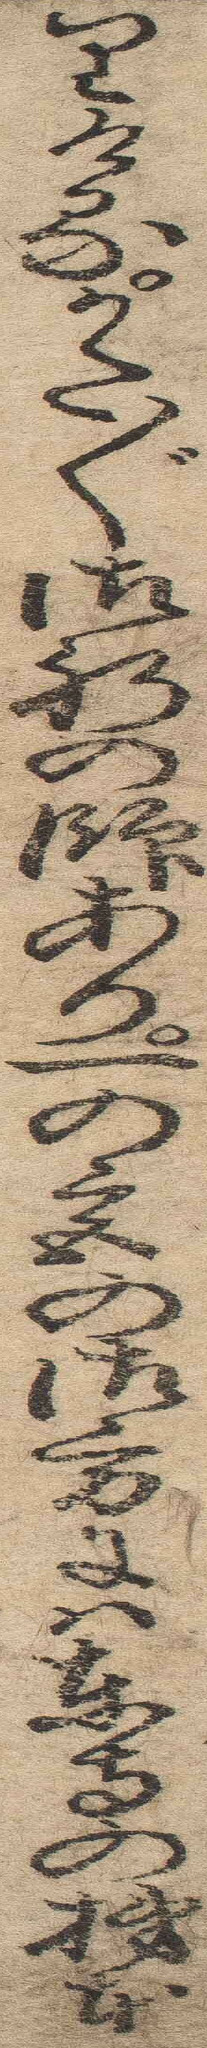りける。かた〴〵御祈の師あり。一の宮の御方には東寺の柿本の
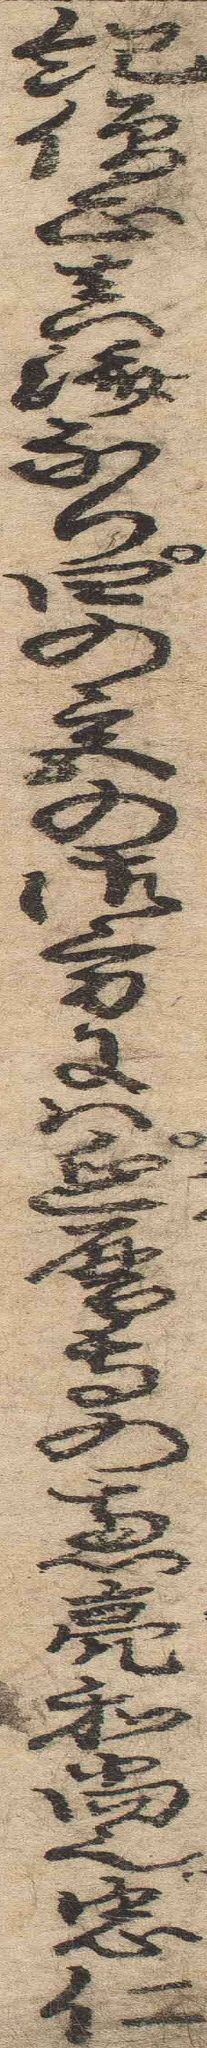紀僧正真済なり。四の宮の御方には延暦寺の恵亮和尚忠仁
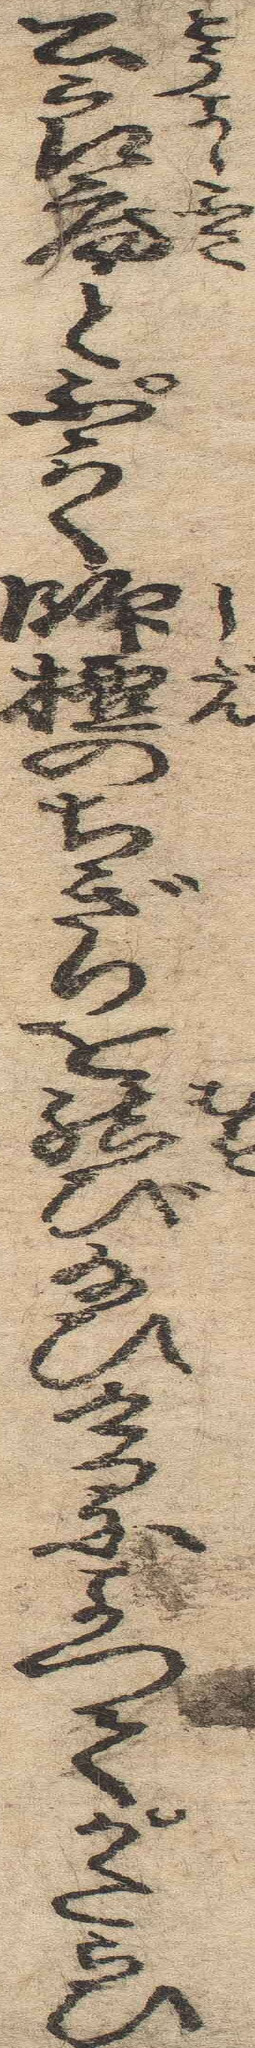公良房と。ふかく師壇のちぎりを結び給ひけるによつて。かたらひ
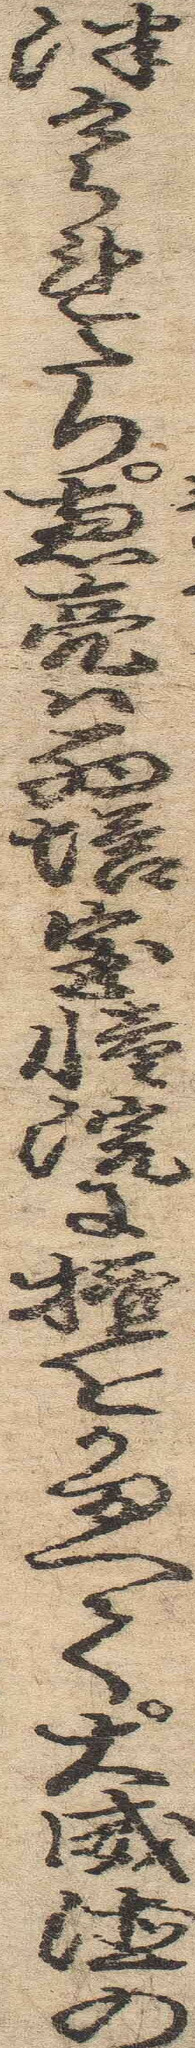つけられたり。恵亮は西塔宝憧院に壇をかまへて。大威徳の
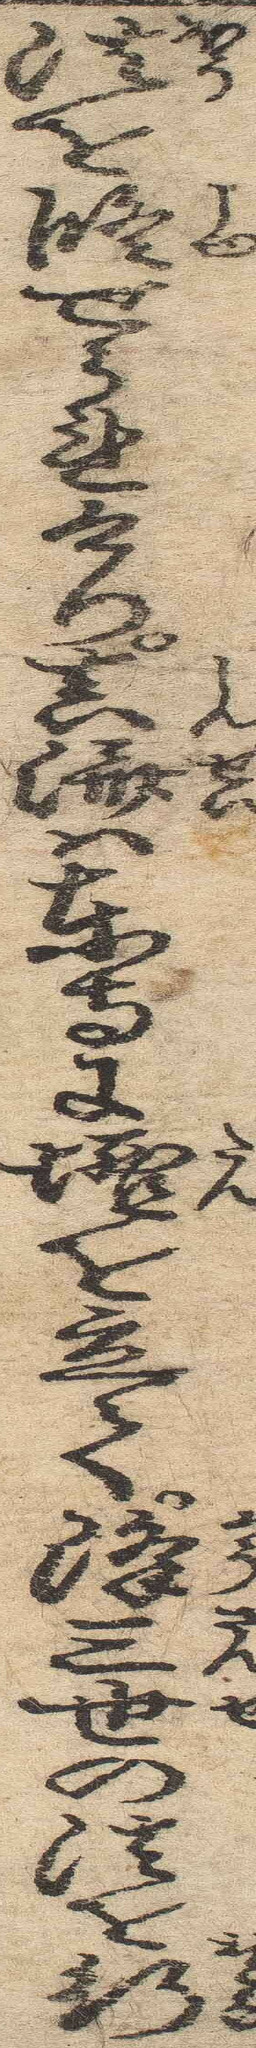法を修せられけり。真済は東寺に壇を立て隆三世の法を行
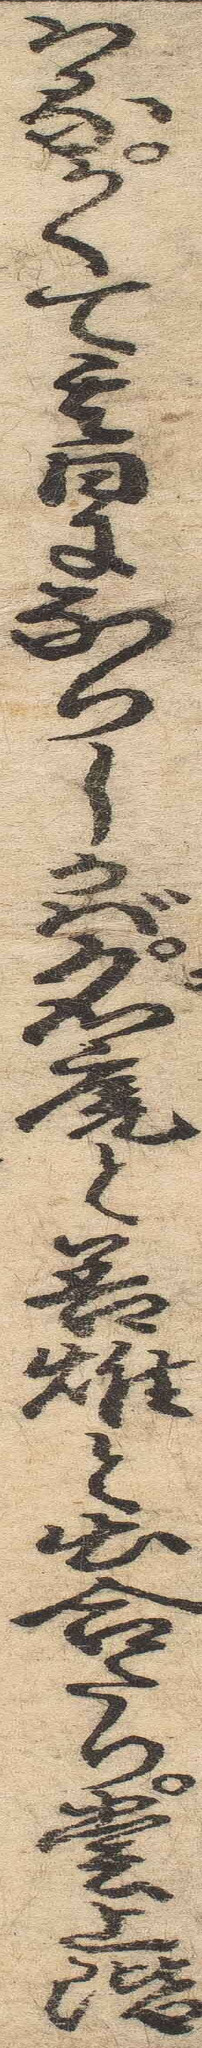はる。かくて其日になりしかば名虎と善雄と出合たり。堂上階
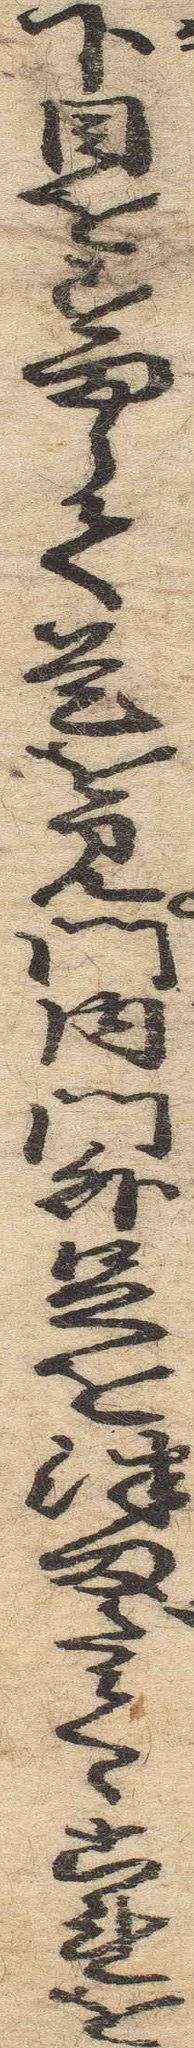下目をすまして是を見。門内門外足をつまだてゝこれを
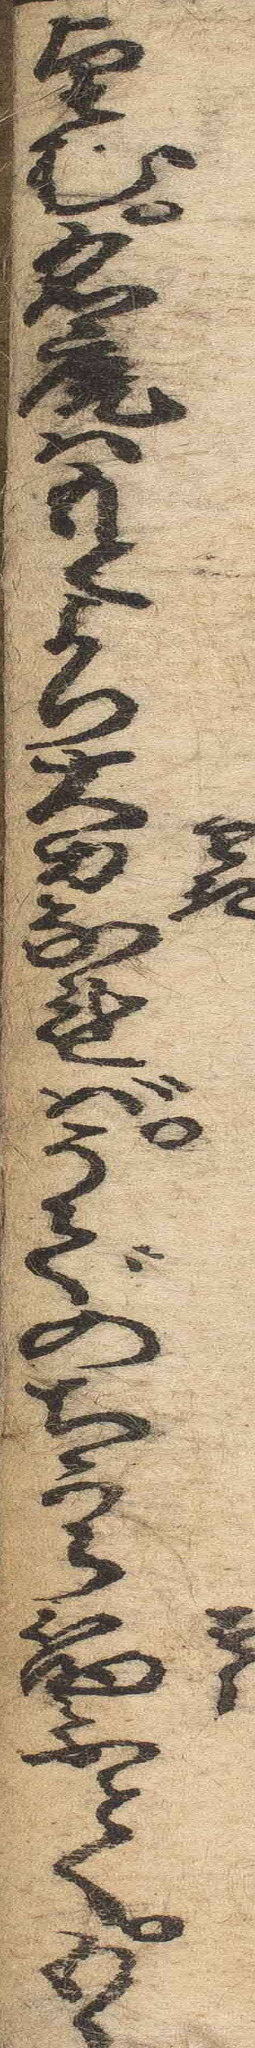望む。名虎はもとより大力なれば。うでのちから筋ふとく。もゝ
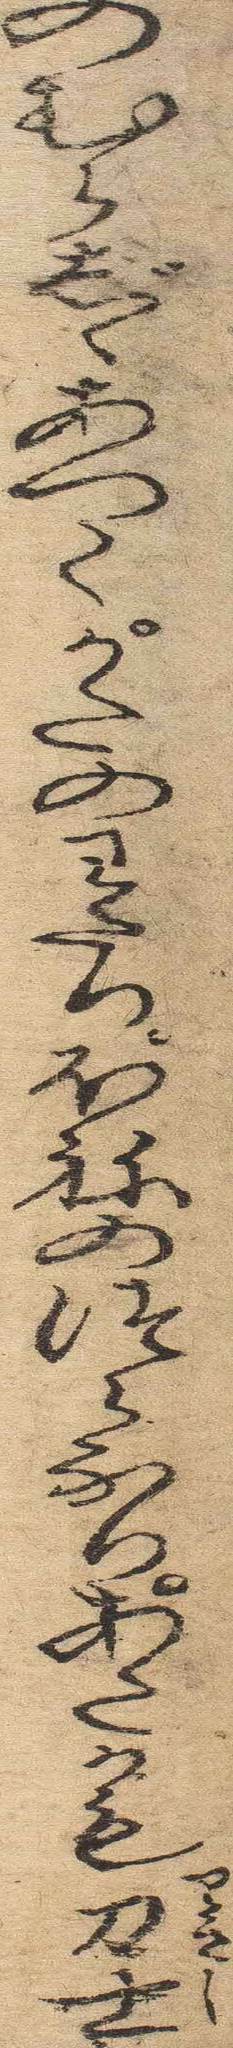のむらじゝあつく。かたのわたりほねのつらなり。あたかも力士
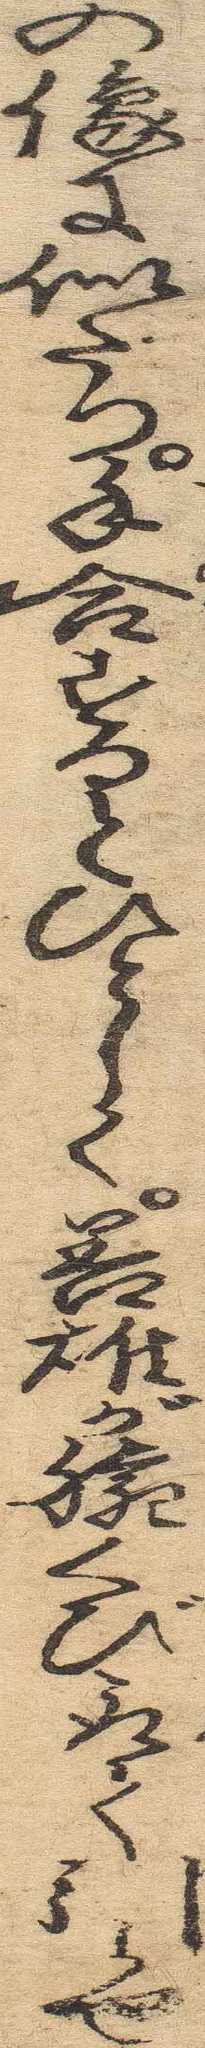の像に似たり。手合するとひとしく。善雄が腕くび取て引よせ
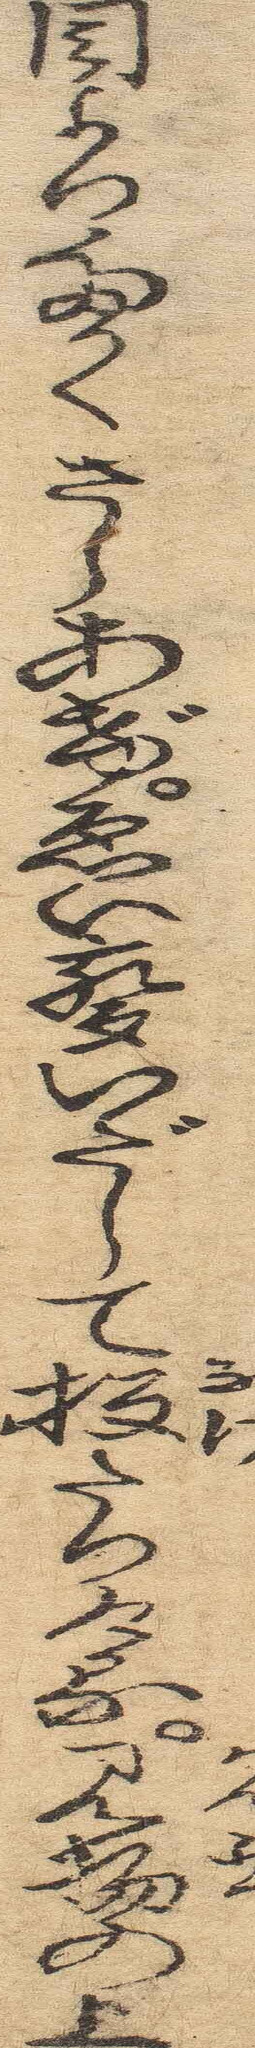目よりたかくさしあげ。ゑい声いだして投たりける。見物の上
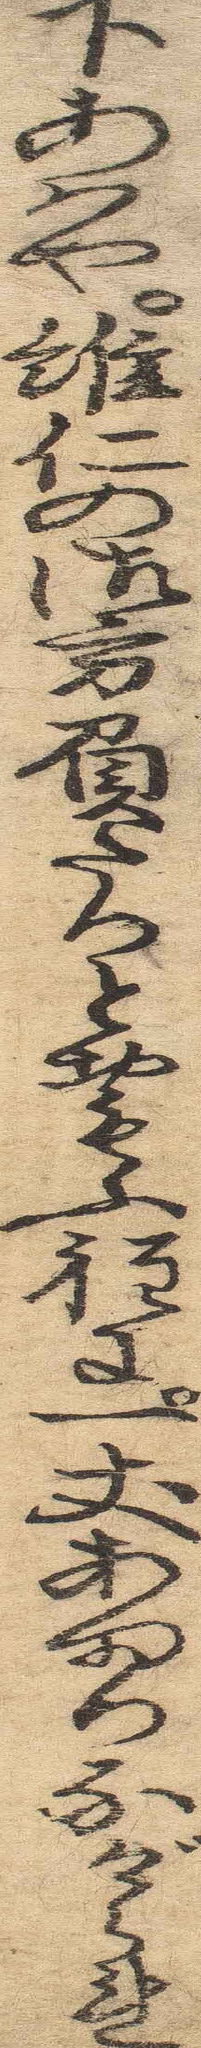下ありや。惟仁の御方負たりとおもふ程に。一丈あまりなげられ
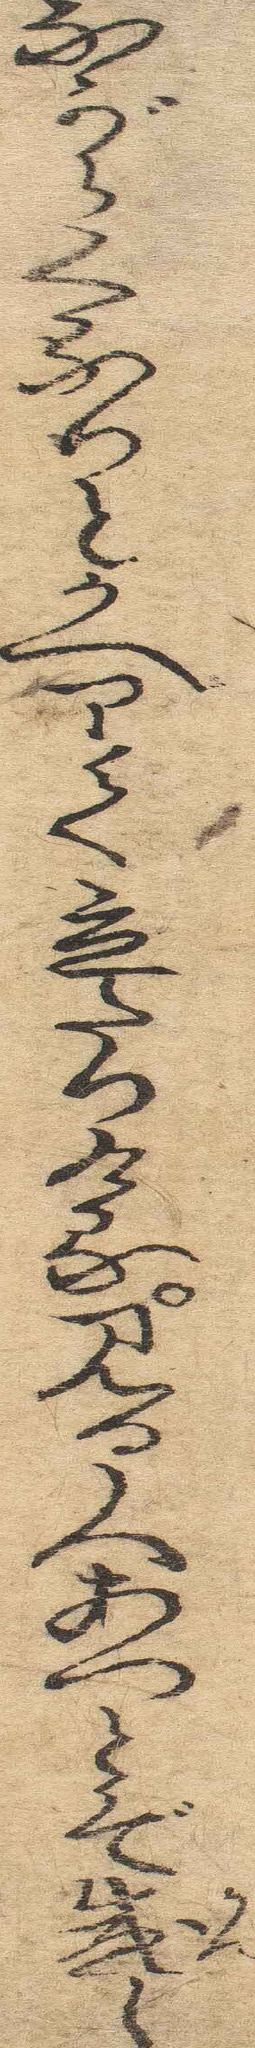ながらくるりとかへりて立たりける。見る人あつとぞ感し
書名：古今相撲大全
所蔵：東京学芸大学附属図書館 国文学研究資料館
